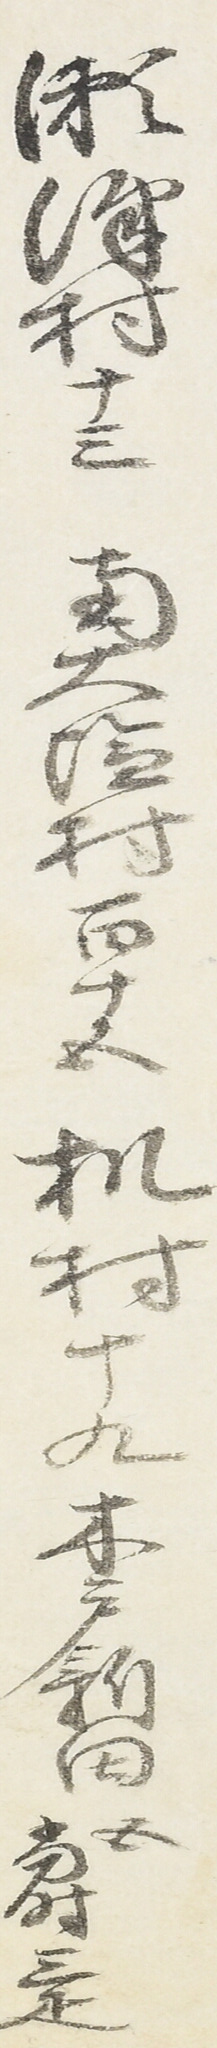瀬沢村十三南大垣村百十五机村十九木戸新田当時三疋
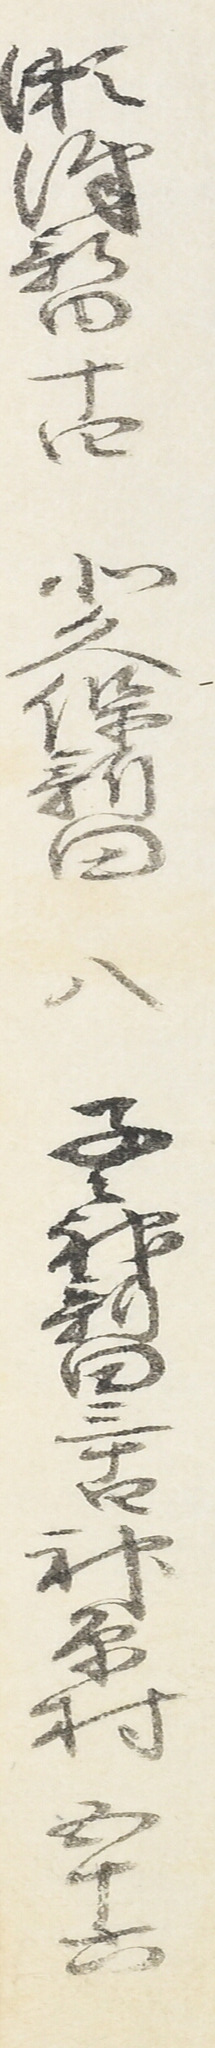瀬沢村新田十四北久保新田八子之神新田三十四神原村五十六

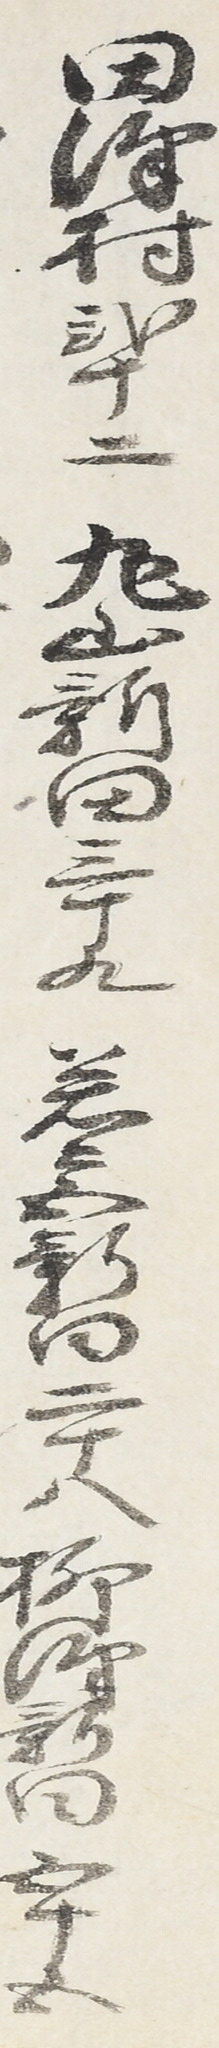田沢村弐十二丸山新田三十九若宮新田二十八柳沢新田五十五
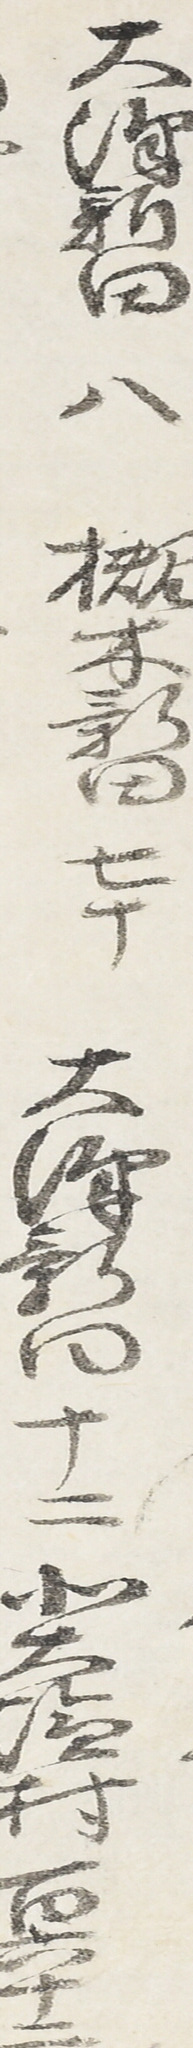大沢新田八槻木新田七十大沢新田十二北大塩村百六十二
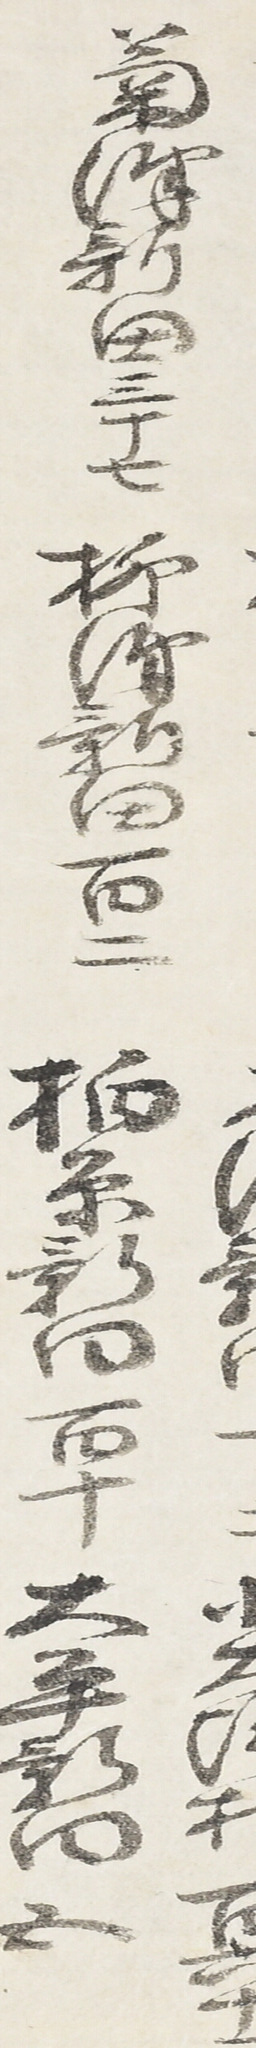菊沢新田三十七柳沢新田百二柏原新田百十大平新田五
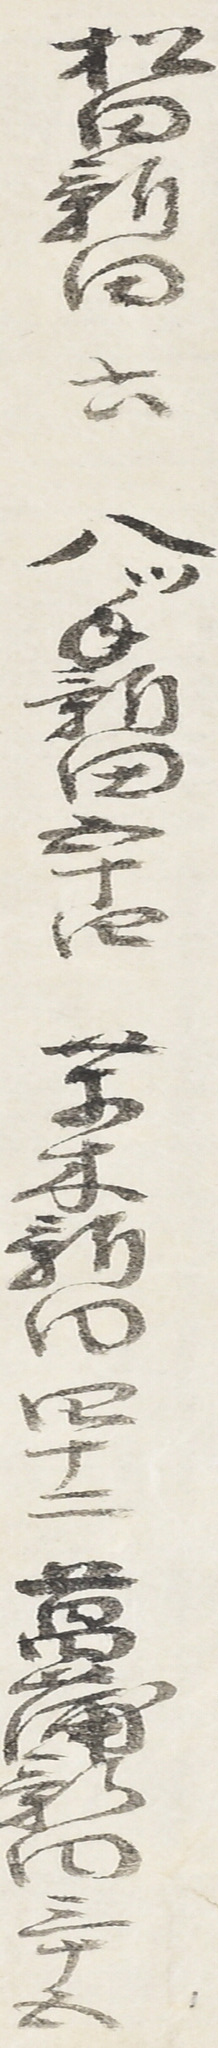松田新田六八ツ手新田五十四草木新田四十二菖蒲新田三十五
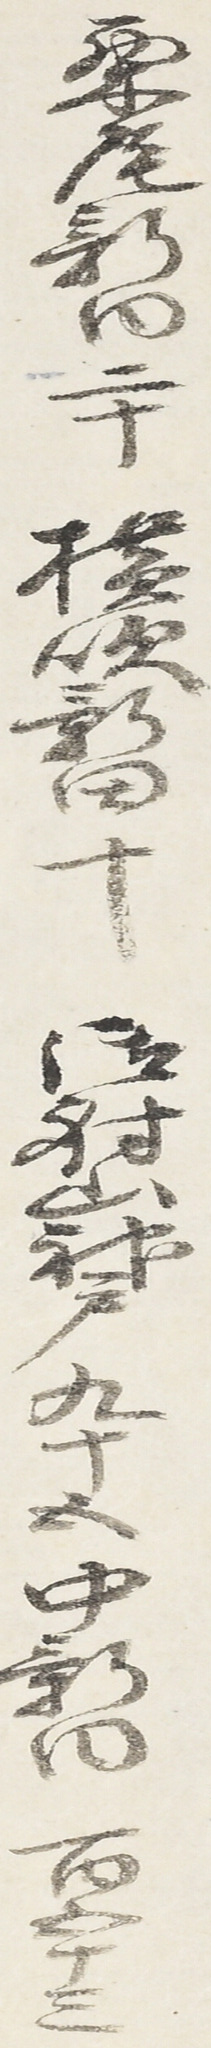栗尾新田二十横吹新田十御射山神戸九十五中新田百五十三
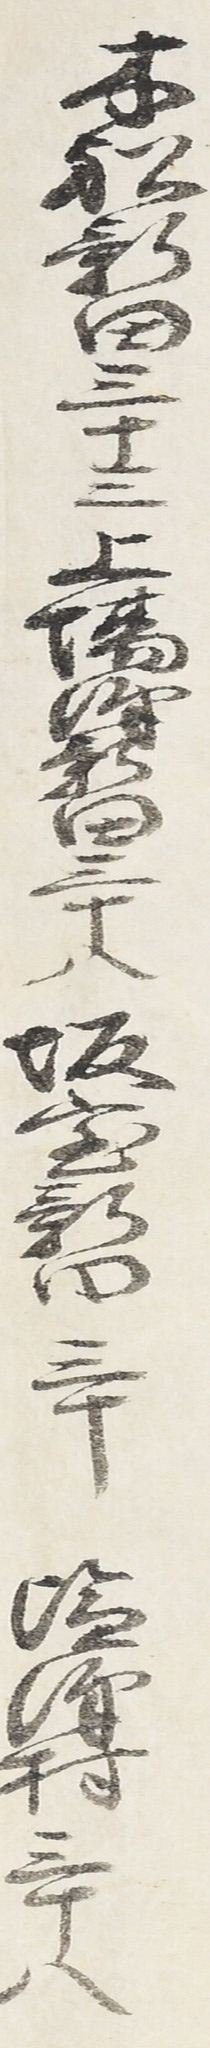木船新田三十三上場沢新田三十八坂室新田三十塩沢村三十八
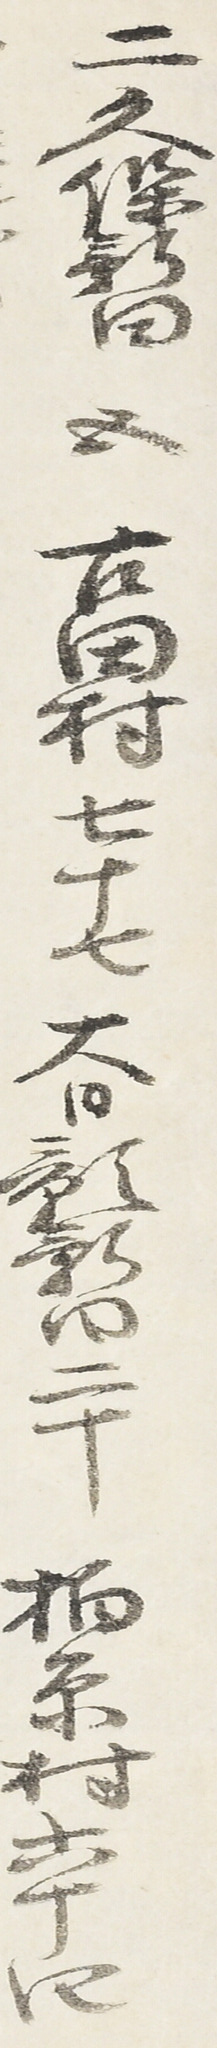二久保新田五古田村七十七大日影新田二十柏原村六十四
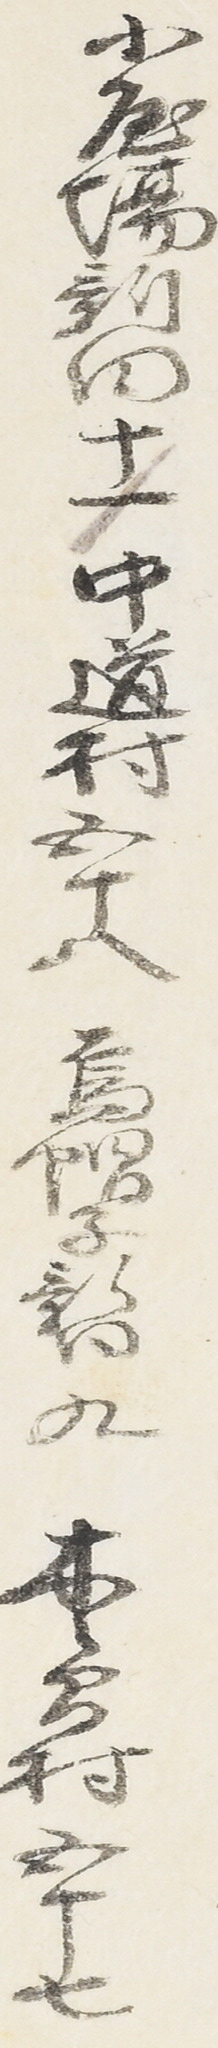小屋場新田十一中道村五十八烏帽子新田九木曽村五十七
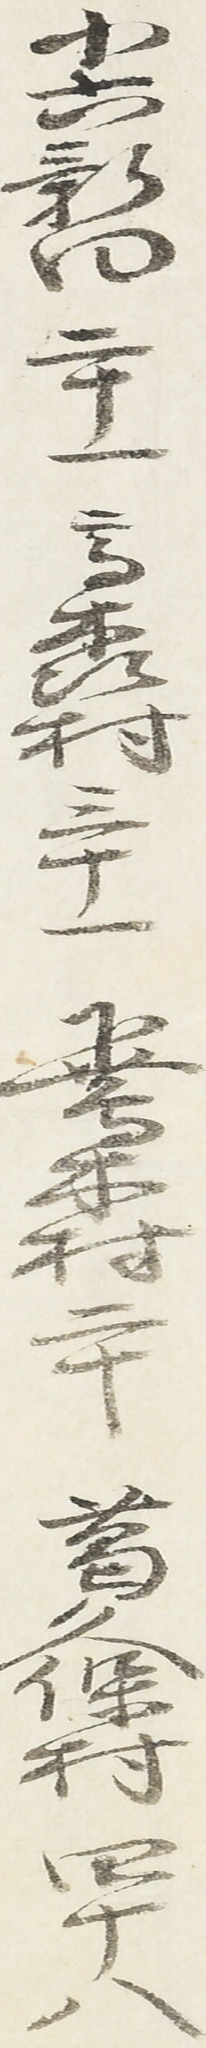小六新田二十一高森村三十一下蔦木村二十葛久保村四十八
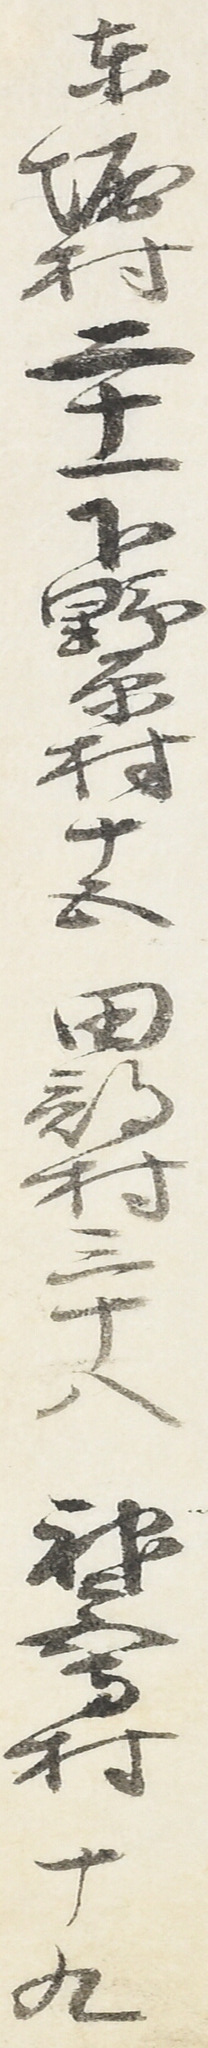東堀村二十一下野原村十五田部村三十八神宮村十九

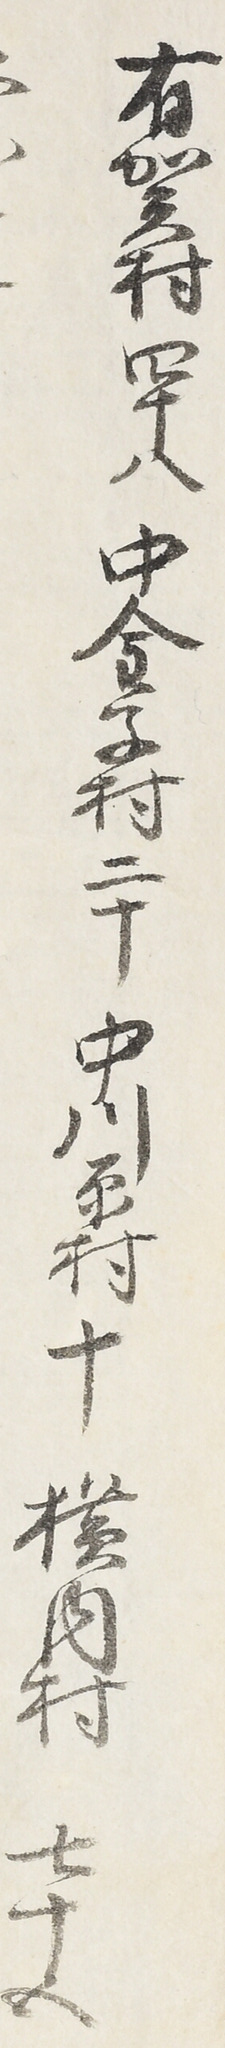有賀村四十八中金子村二十中川原村十横内村七十五
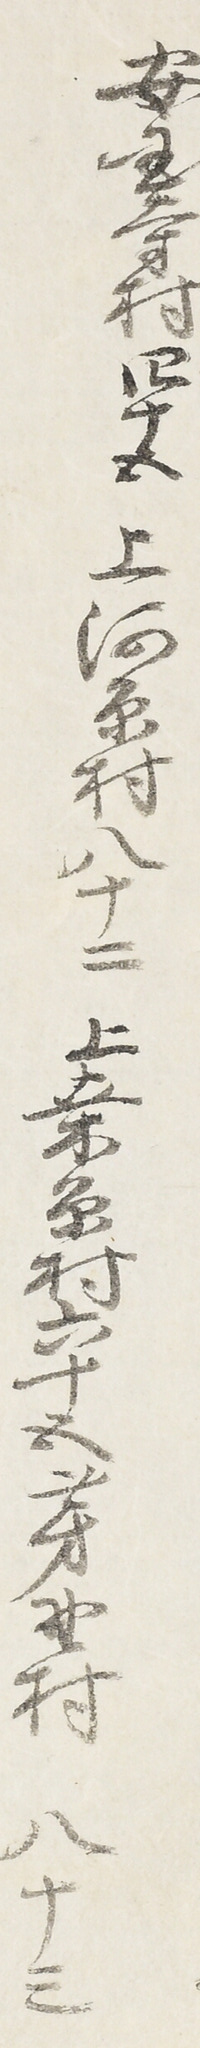安国寺村四十五上河原村八十二上桑原村六十五茅野村八十三
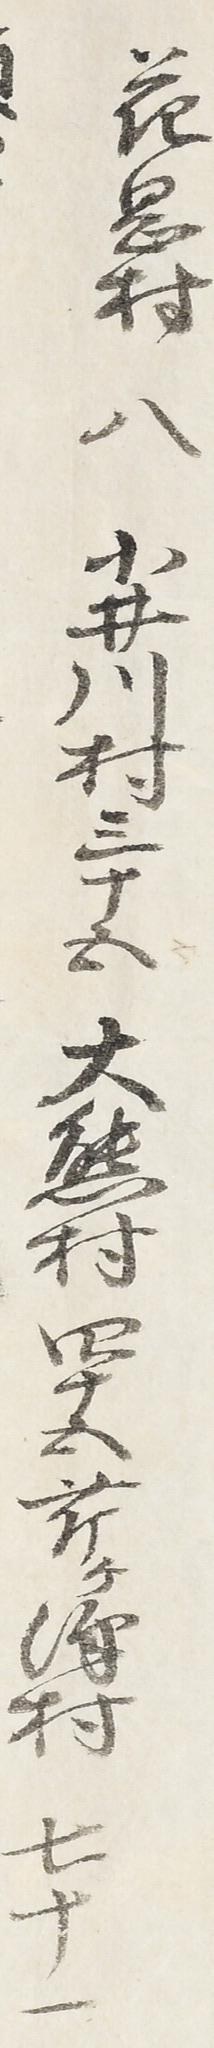花岡村八小井川村三十五大熊村四十五芹ヶ沢村七十一
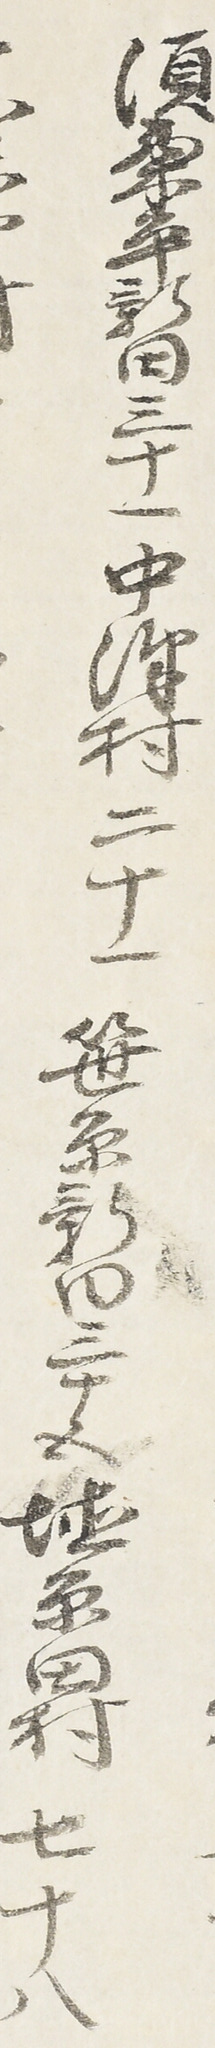須栗平新田三十一中沢村二十一笹原新田三十五埴原田村七十八
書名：中馬御裁許帳面
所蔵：伊那市立高遠町図書館・合同会社AMANE
